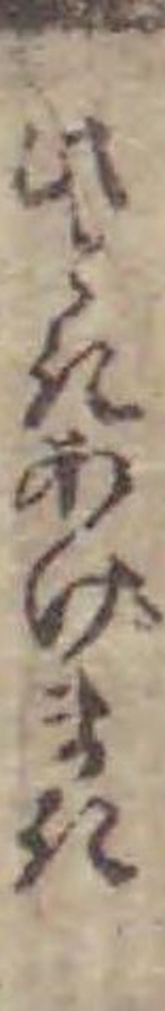此ときあげまき
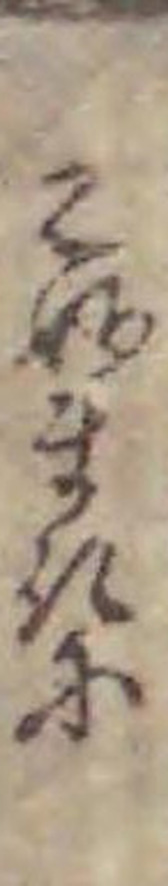こふまきに
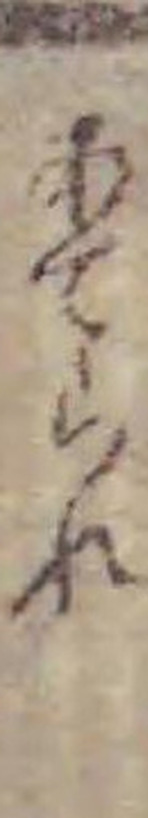あてられ
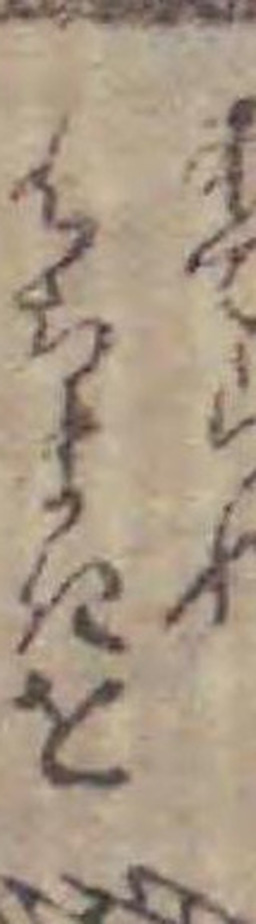はちまきを
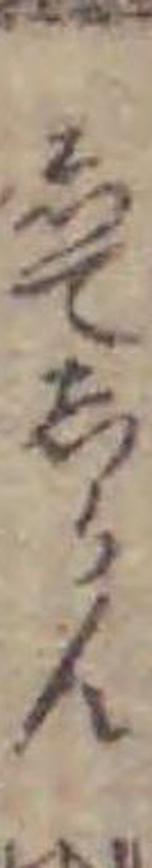してしらん
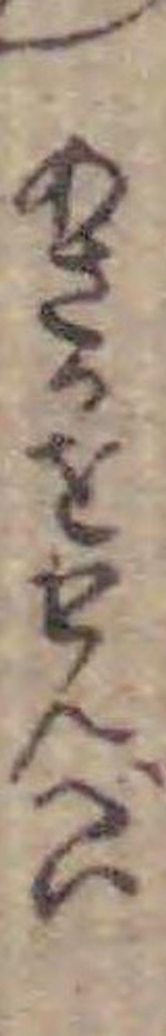あさかをせんべい
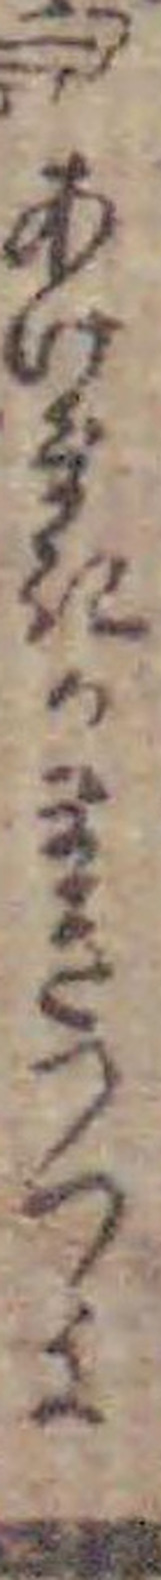あけまきかまきつつに
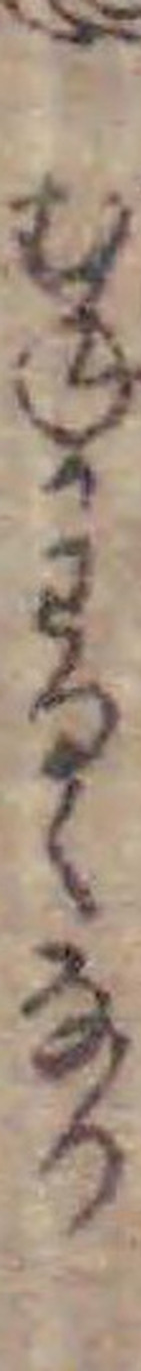むねかわるくなり
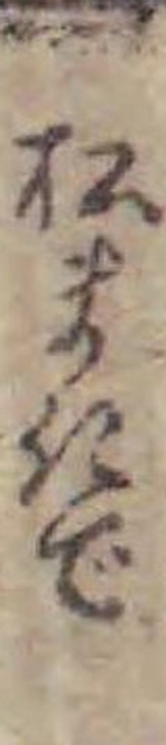松まきで
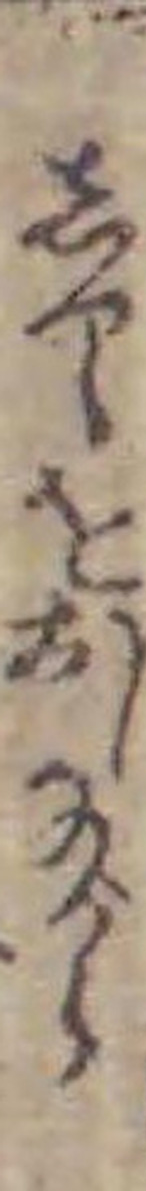しアヽをおしなから
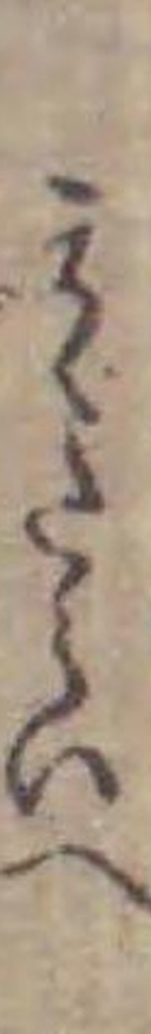ミゝたらいへ
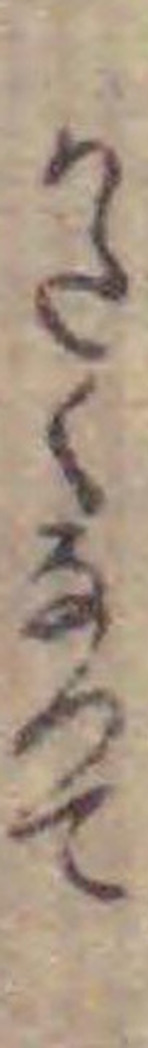かたくなつて
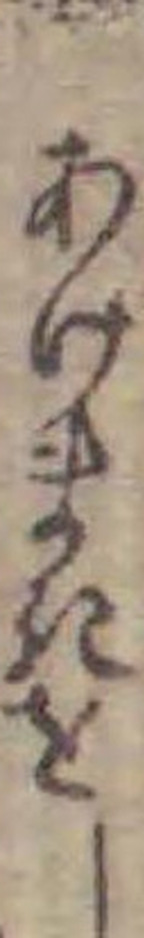あげまきを
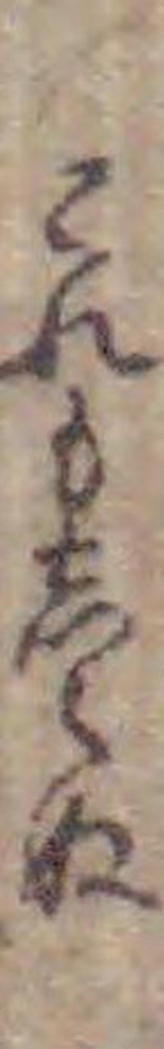これもしらぬ
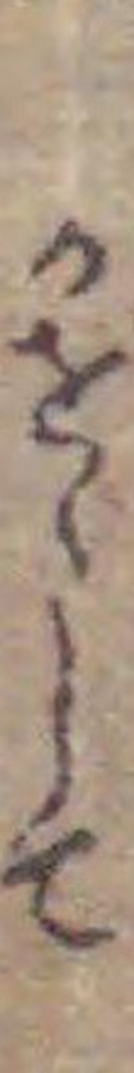かをゝして

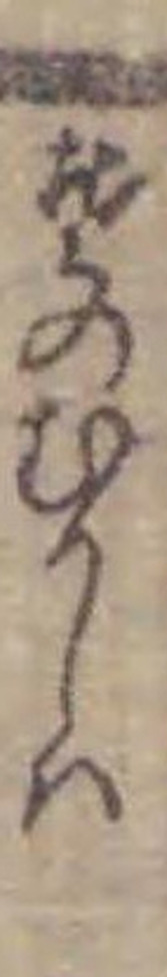そのむかしは
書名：年寄之冷水曽我 : 3巻
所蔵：国立国会図書館 National Diet Library, JAPAN
